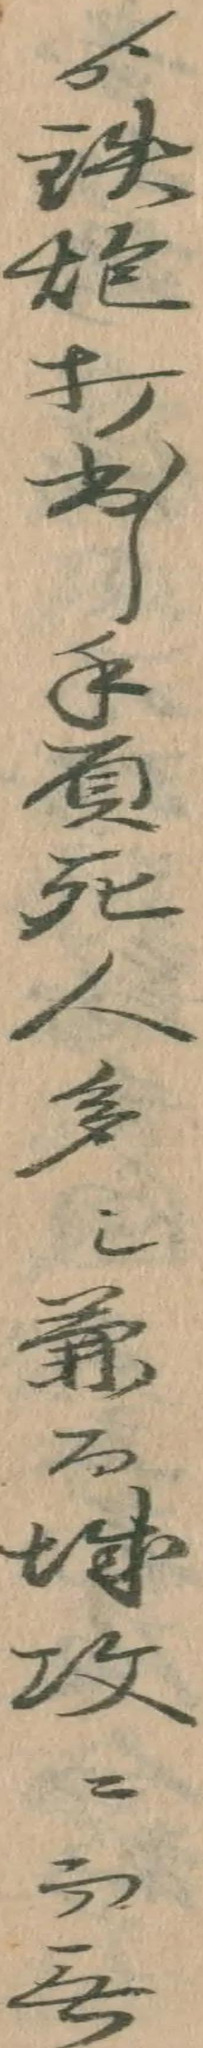ゟ鉄炮打出し手負死人多し兼而城攻に而無
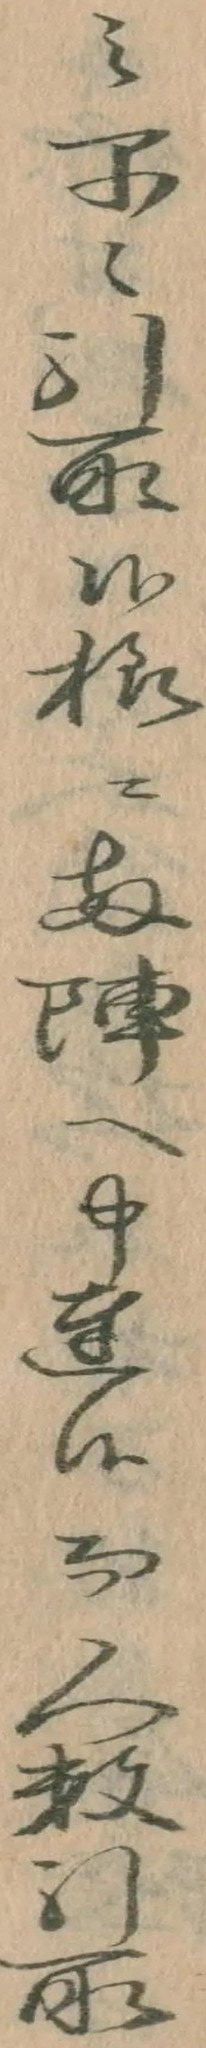之早々引取候様に両陣へ申達候而人数引取
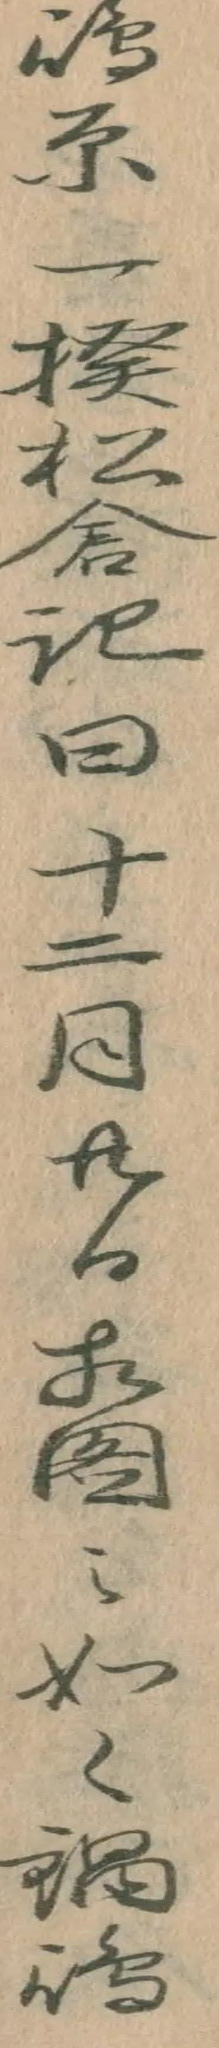島原一揆松倉記曰十二月廿日相図之如く鍋島
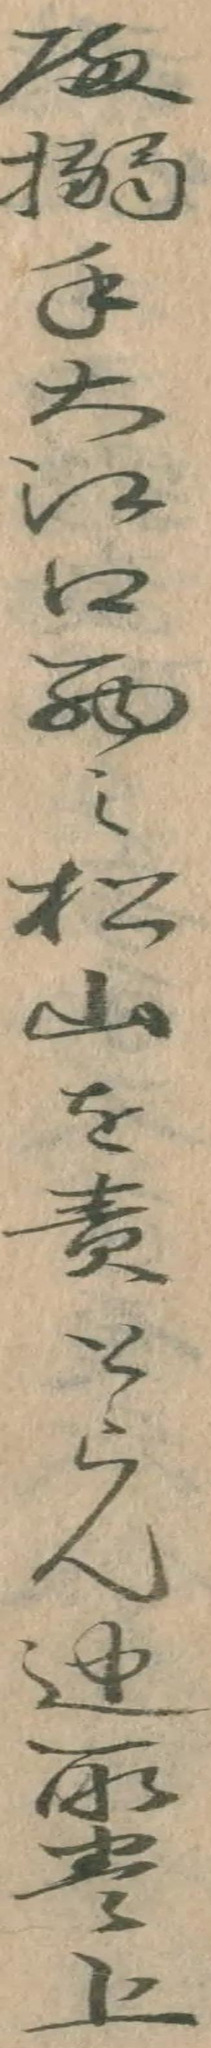殿搦手大江口西之松山を責とらん迚取巻上
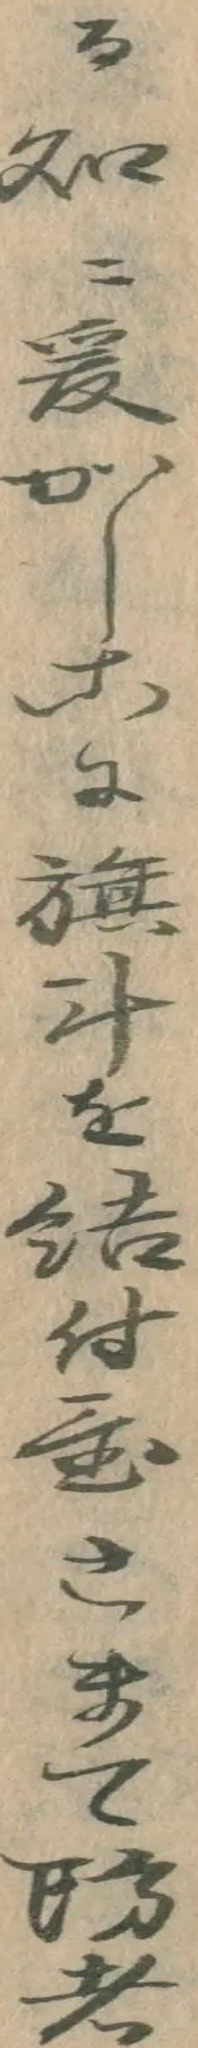る処に爰かし古尓旗斗を結付置さまて防者
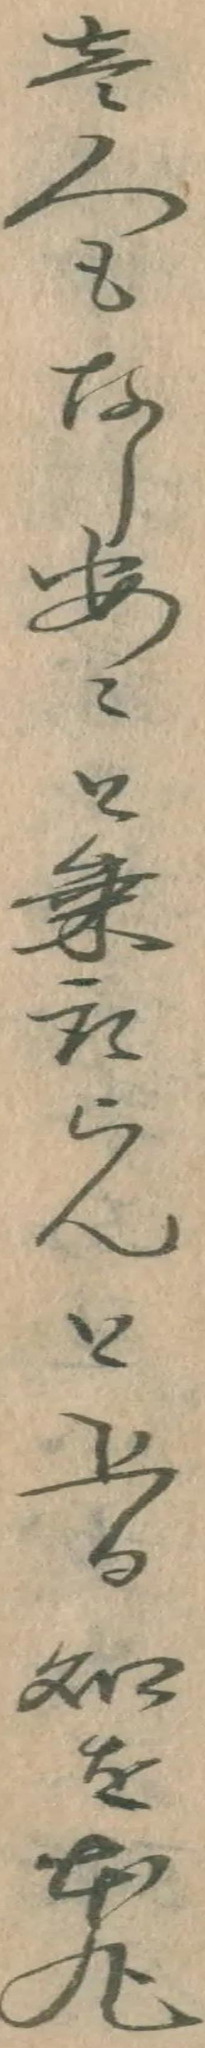壱人もなし安々と乗取らんと上る処を本丸
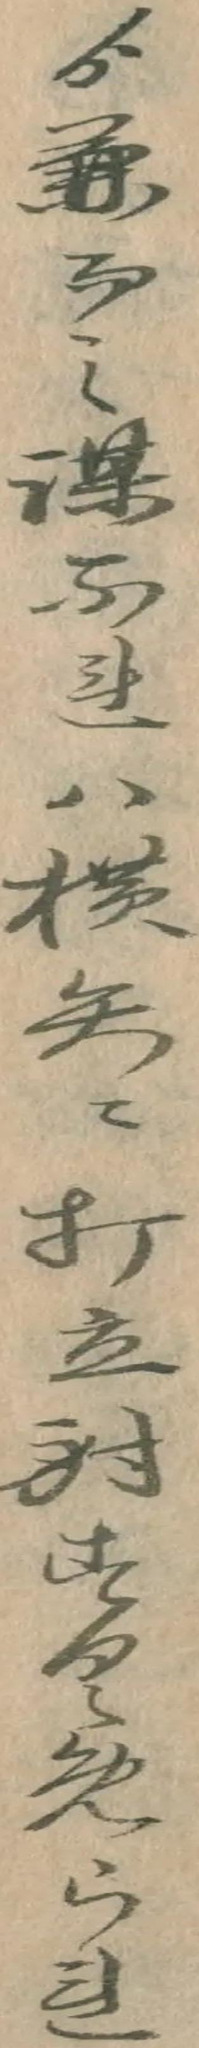ゟ兼而之謀な連は横矢に打立射春具免ら連
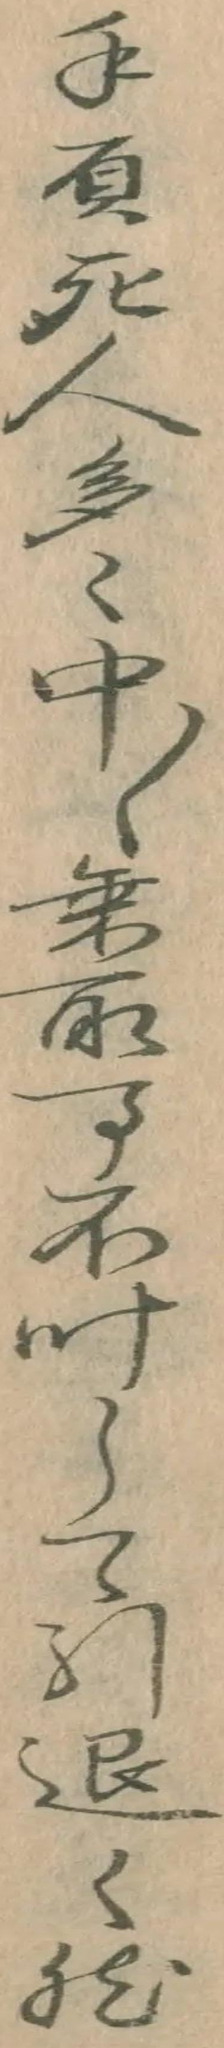手負死人多く中々乗取事不叶して引退く然

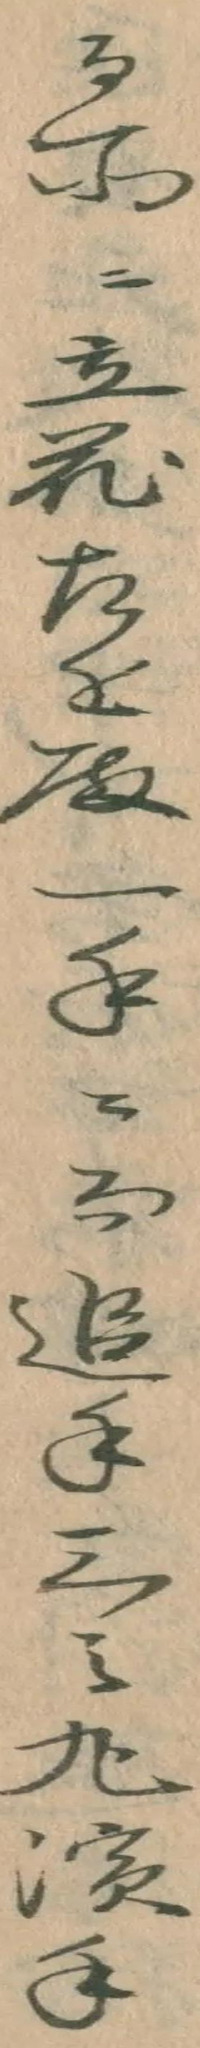る所に立花左近殿一手に而追手三之丸浜手
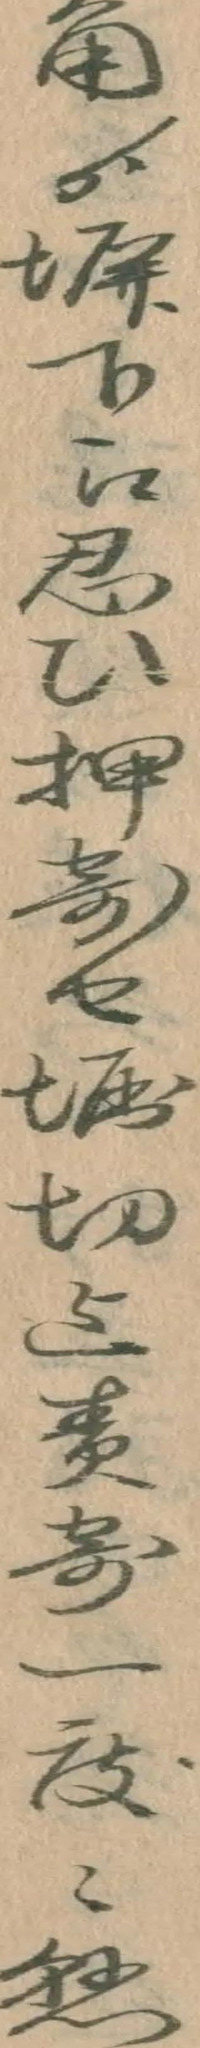角ゟ塀下江忍ひ押寄せ堀切迄責寄一度に懸
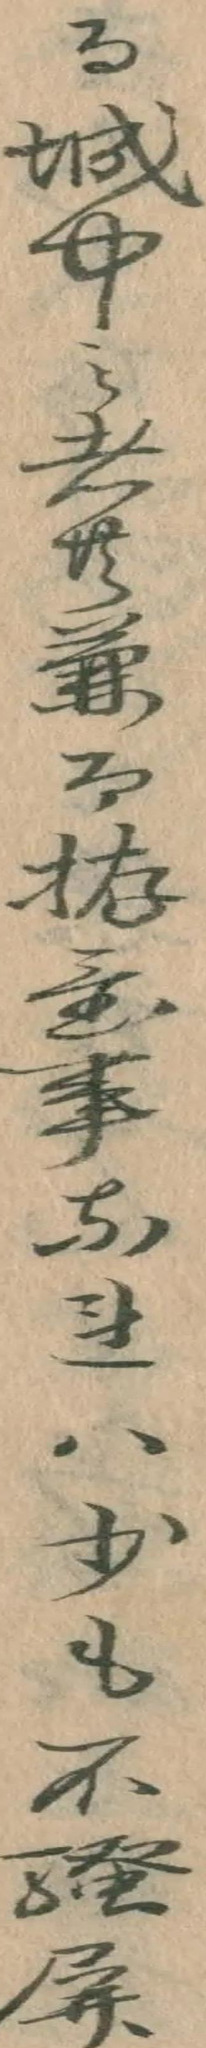る城中之者共兼而拵置事な連は少も不騒屏
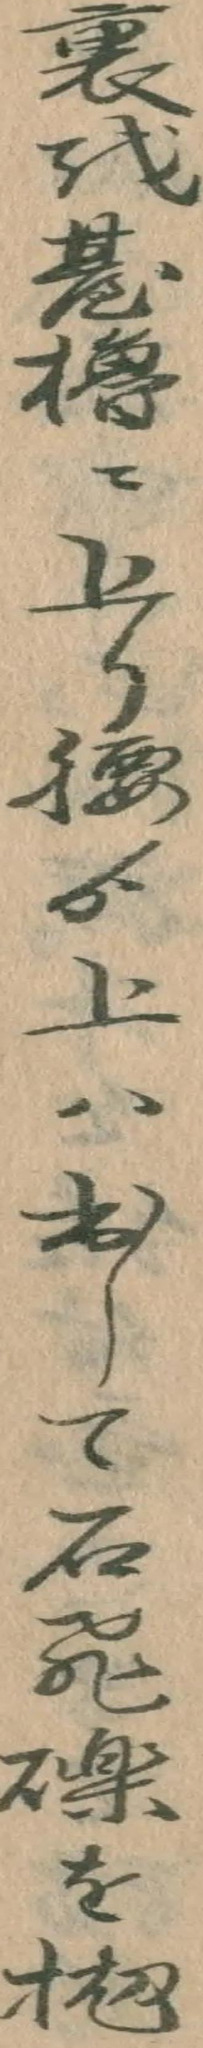裏越台樽に上り腰ゟ上は出して石飛礫を抛
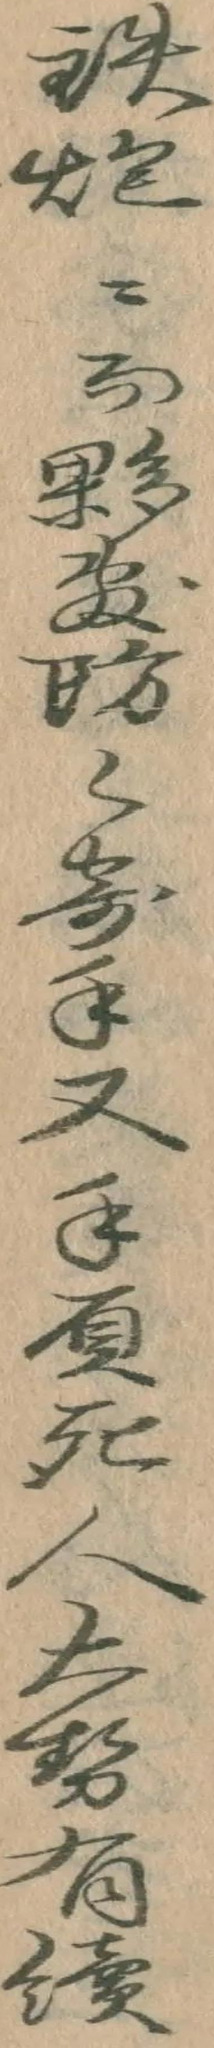鉄炮に而夥敷防く寄手又手負死人大勢有続
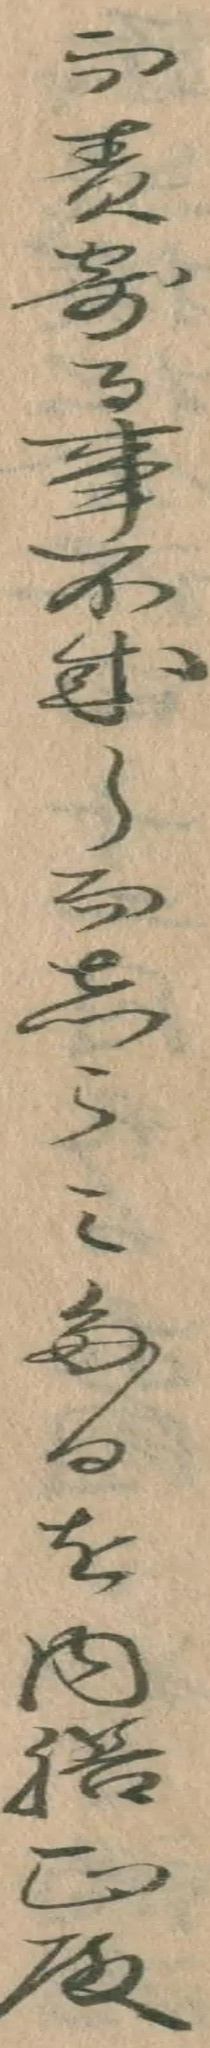而責寄る事不成し而志らみ多るを内膳正殿
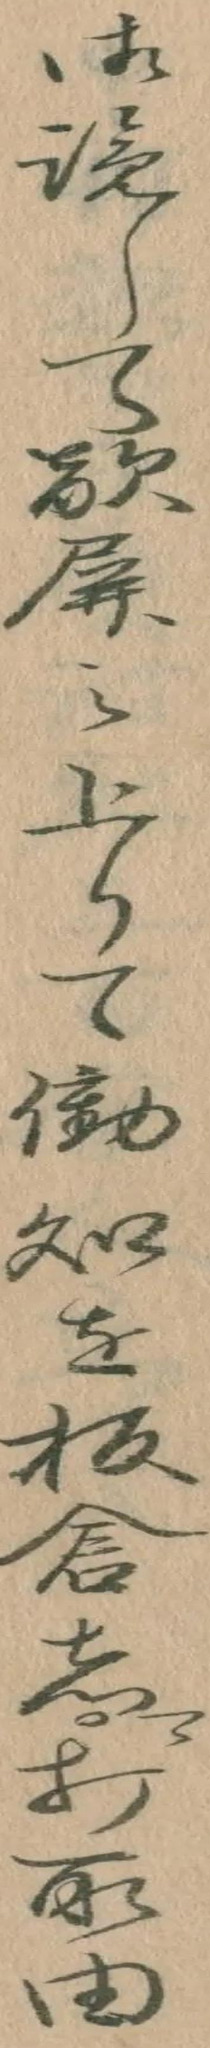御覧して敵屏之上りて働処を板倉志打取由
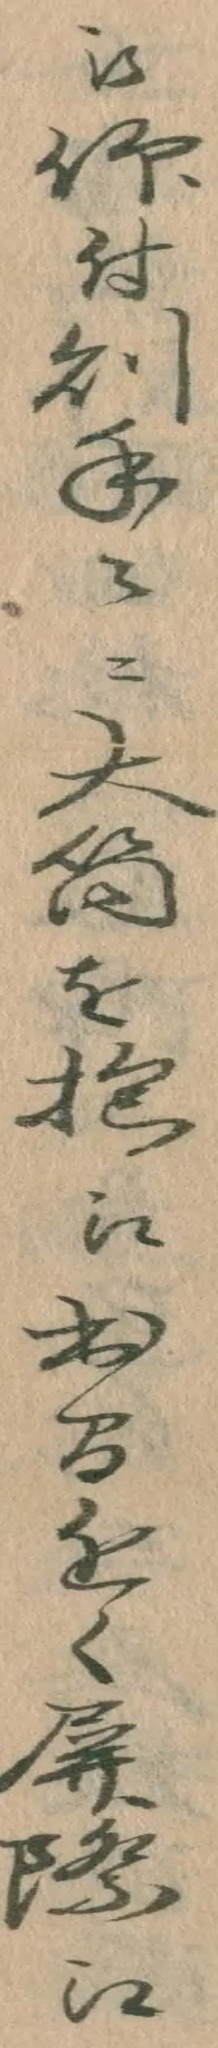被仰付則手々に大筒を抱江出間近く屏際江
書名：切支丹御退治記 49巻. [4]
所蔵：国立国会図書館 National Diet Library, JAPAN
